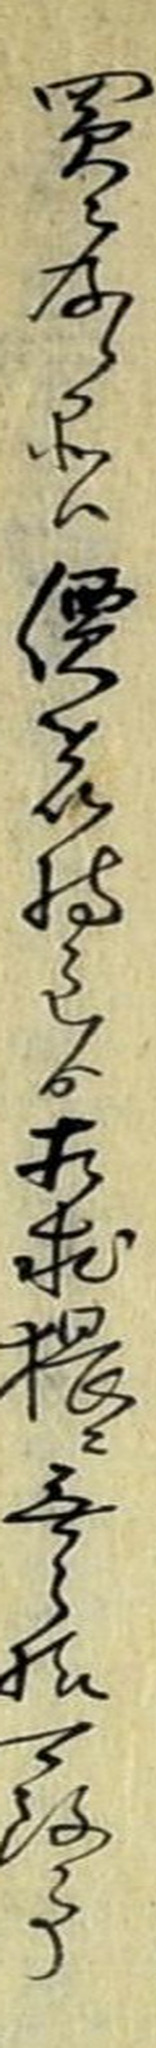買ニ及候品ハ価を以持主ゟ相求猥ニ無之様可致事
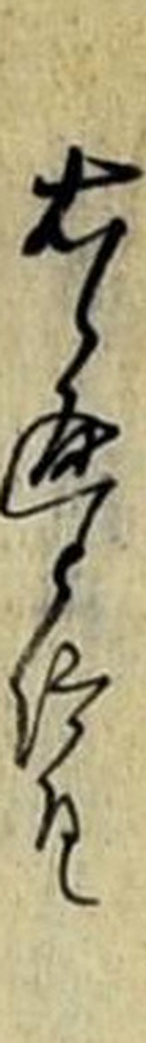右之通被仰付候
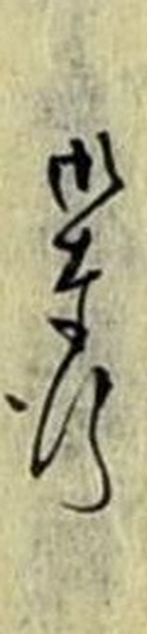町奉行
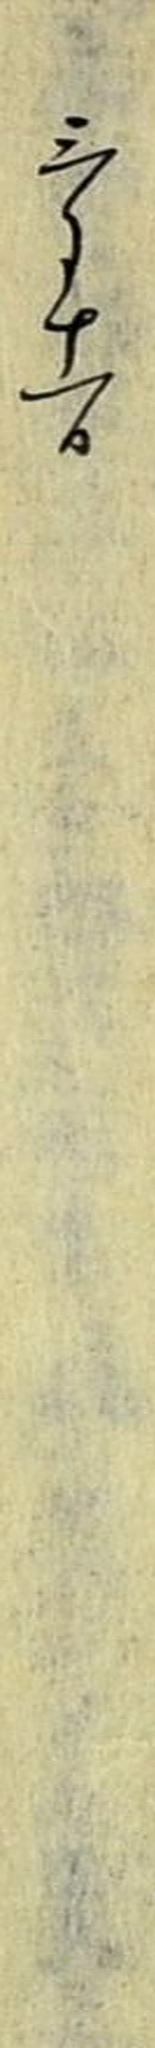三月十一日
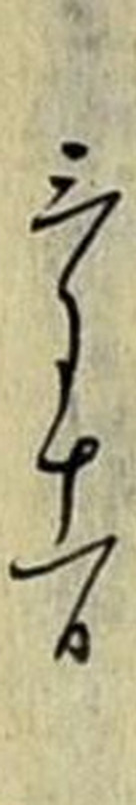三月十一日
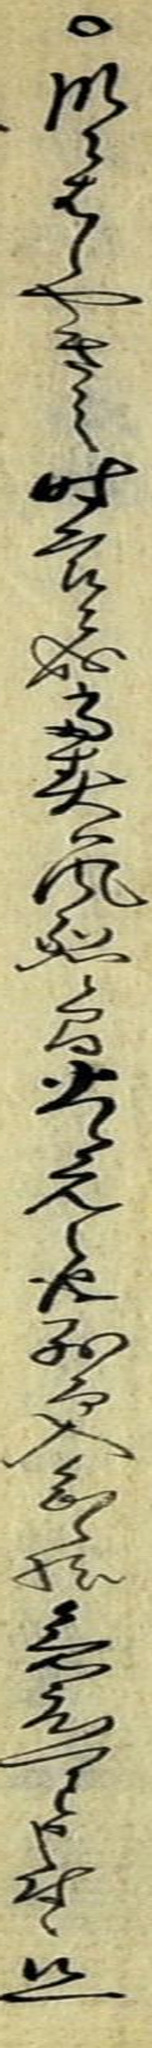〇段々はしやき之時節ニ成当春ハ風烈候間火之元之儀別而入念候様急度可被申付候且
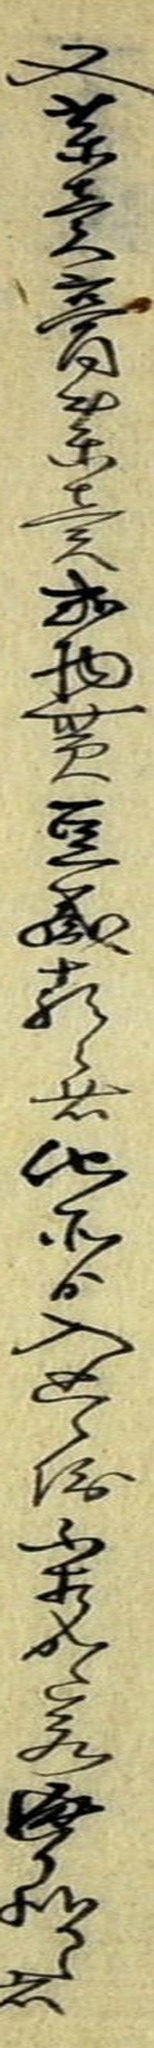又薬売膏薬売或物貰豆蔵類之者他所ゟ入込候儀不相成候若通り掛り候者
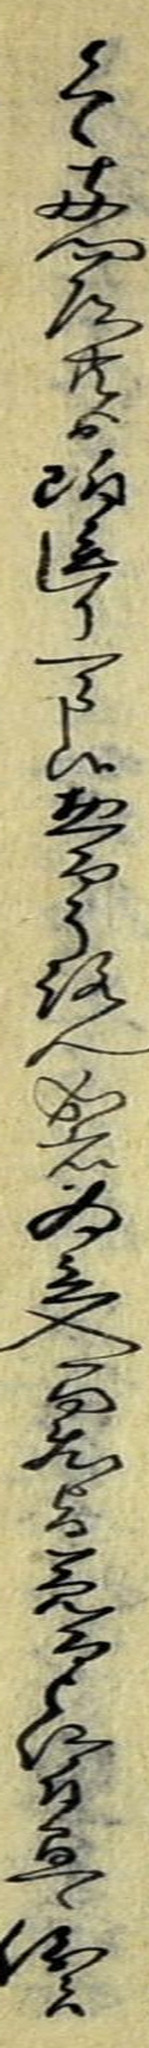候ハヽ両問屋共ゟ付送り可申候惣而うろん成者為立入間敷旨兼而被仰付置候儀ニハ
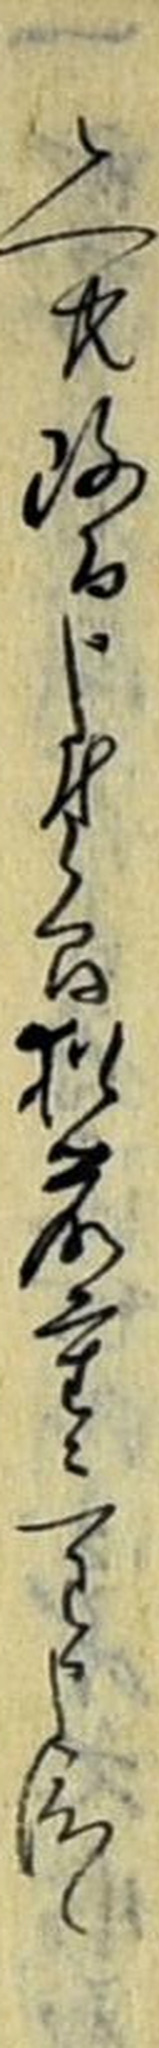候へ共改而申付候間猶厳重ニ可被申渡候

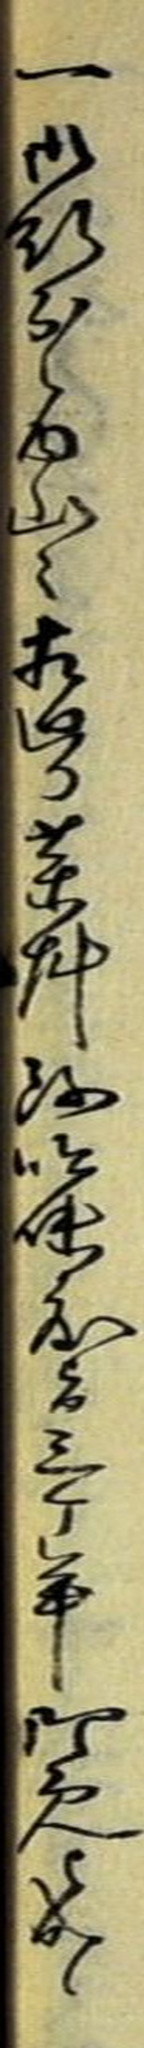一御領分之内山々相廻り薬艸致吟味度旨三ケ年御免被成候
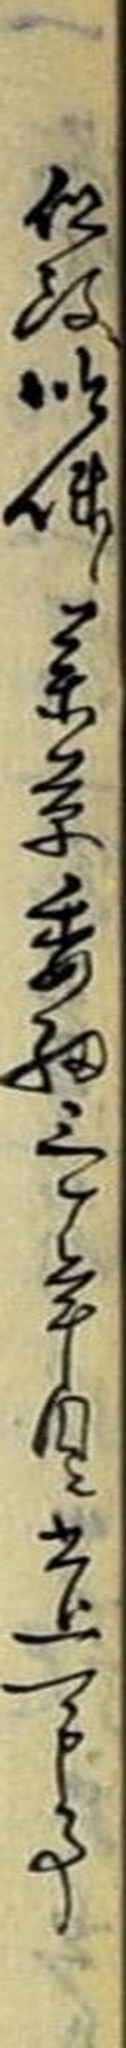但致吟味候薬草委細三ケ年目ニ書上可申事

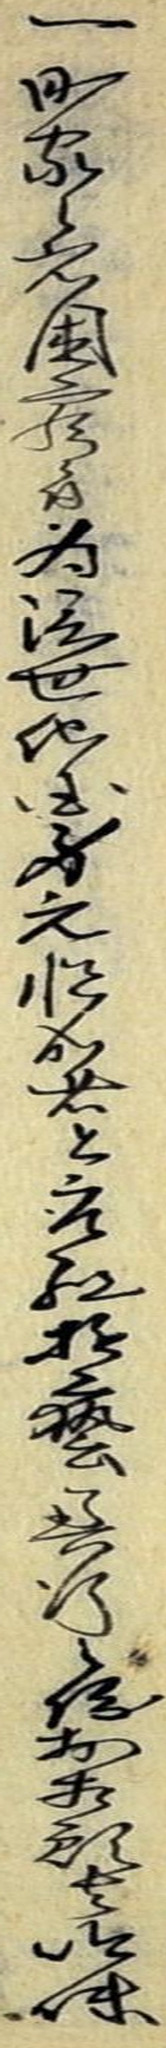一町家之者困窮ニ付為渡世他国身元慥成者と取組遊芸興行之儀於相願者吟味
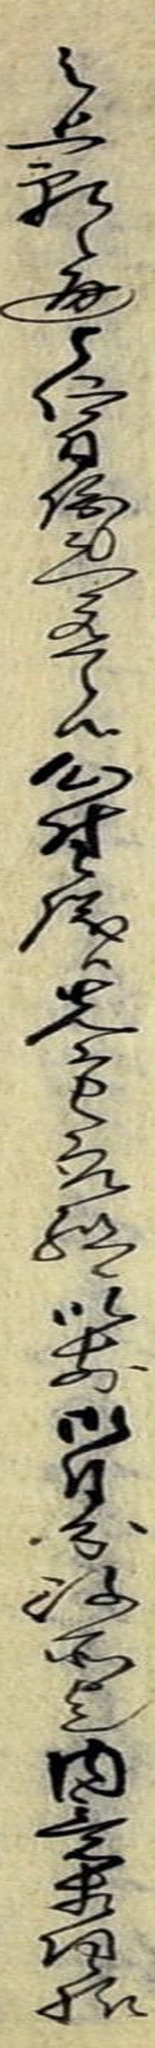之上願之通被仰付儀も可有之候心付之儀ハ先方へ取組候以前御自分役所迄内意相伺候様
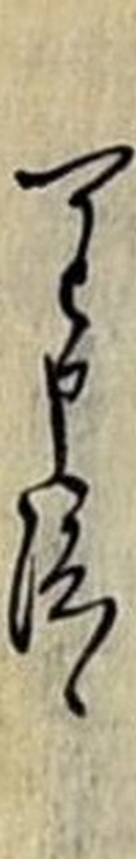可被申渡候
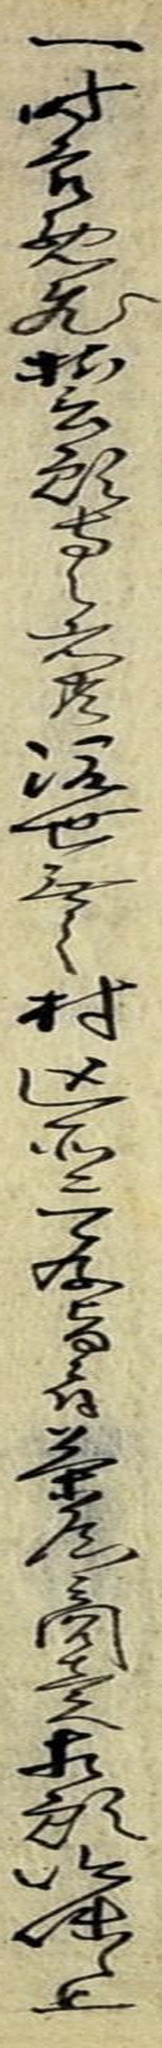一時節悪敷誓願寺之者共渡世無之村凶所？ニ可及旨ニ付茶屋商売相願吟味之上
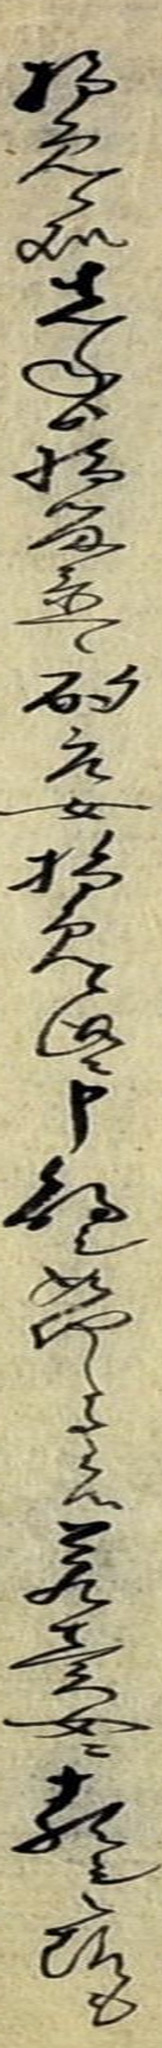指免候処先年ゟ指留置候酌取女指免候趣ニ申触シ如何之事ニ候若売女ニ類シ候趣も
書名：命令之部 三
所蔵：福井県文書館 Fukui Prefectural Archives
